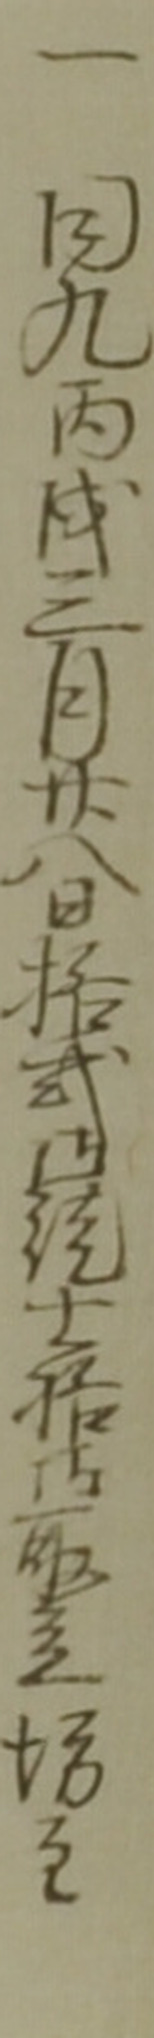一同九丙戌三月廿八日格式御徒士格御取立坊主
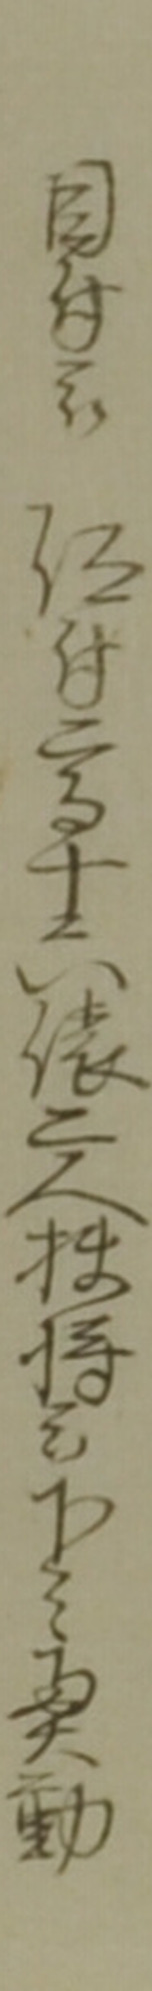目付被仰付高十六俵二人扶持被下之奥勤
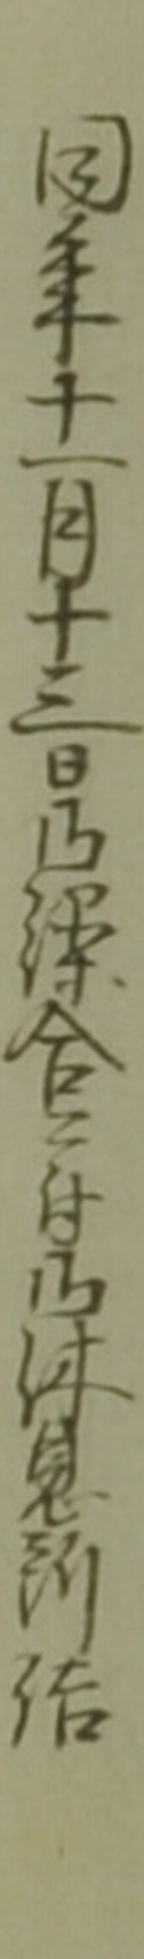一同年十一月十三日御繰合ニ付御休息所詰
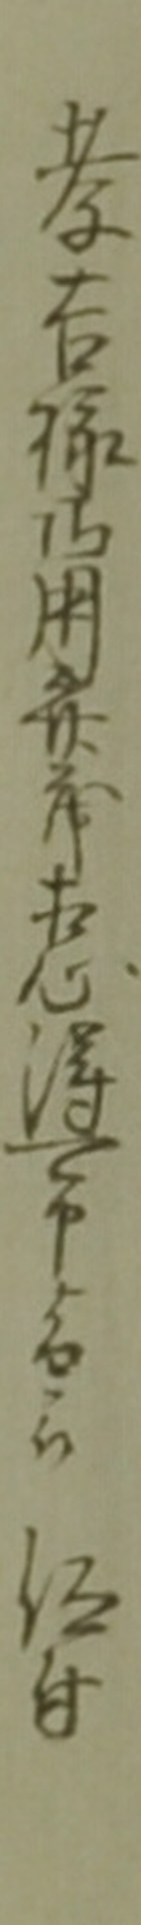孝吉様御用弁茂相心得可申旨被仰付

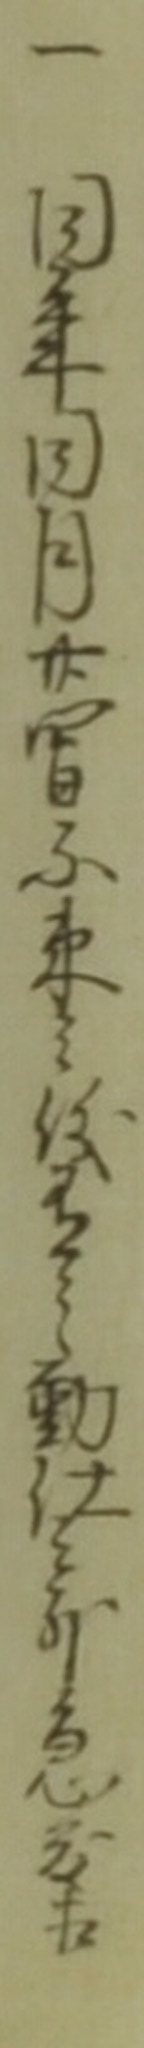一同年同月廿四日不束之儀有之勤仕之外急度相
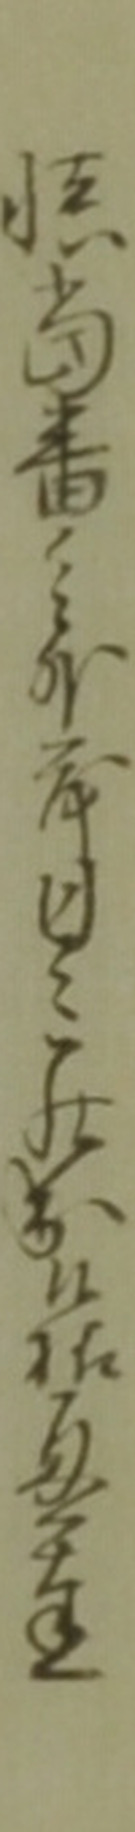慎当番之外茂日々罷出候通達
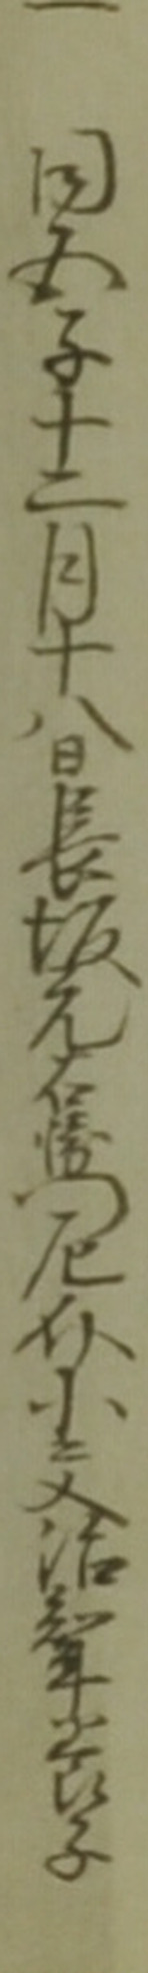一同五子十二月十八日長坂元右衛門厄介小文地治聟養子

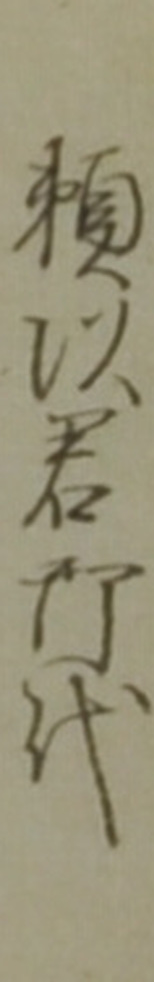頼以君御代
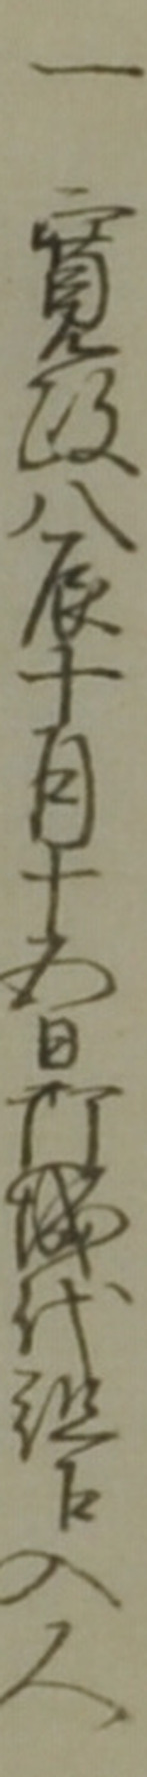一寛政八辰十月十五日御城代組江入人
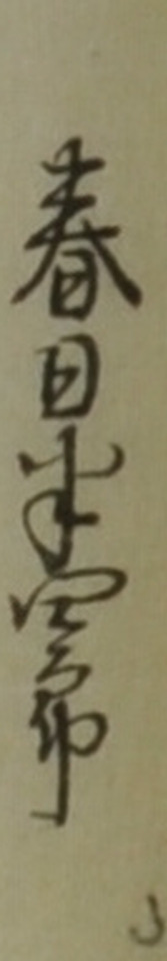春日半四郎
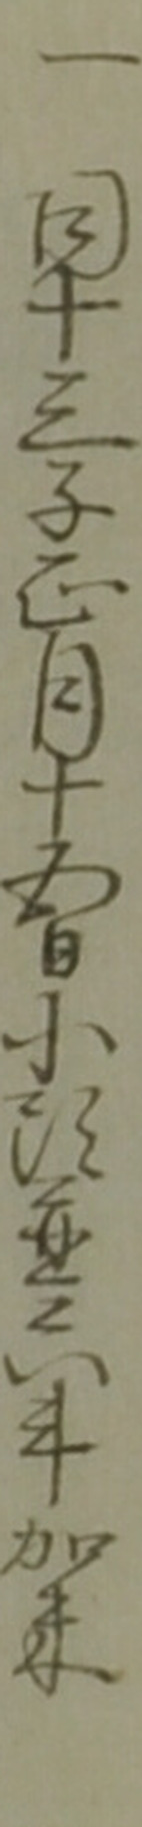一同十三子正月十五日小頭並六斗加米
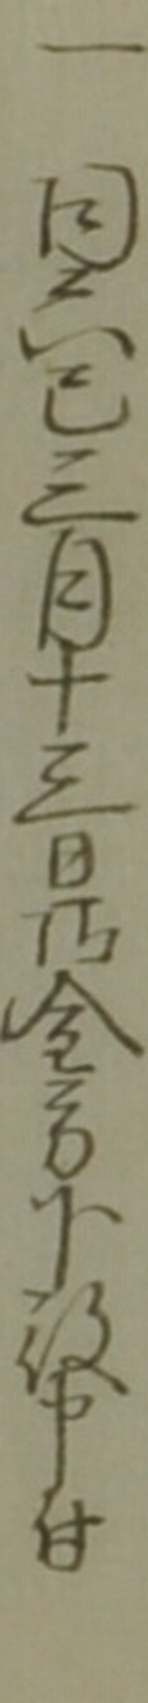一同六巳三月十三日御金方下役申付
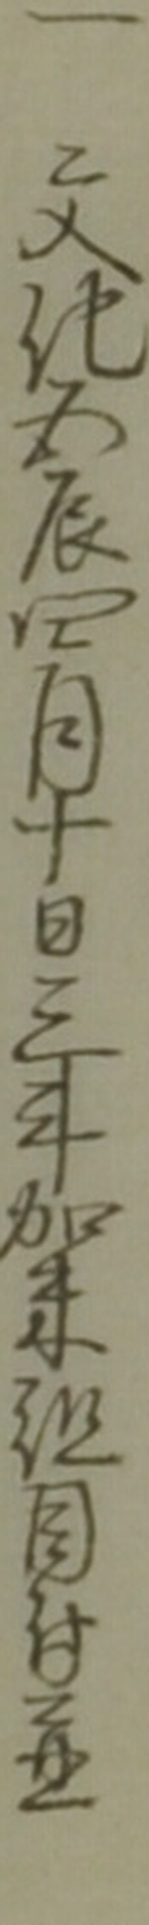一文化五辰四月十日三斗加米組目付並
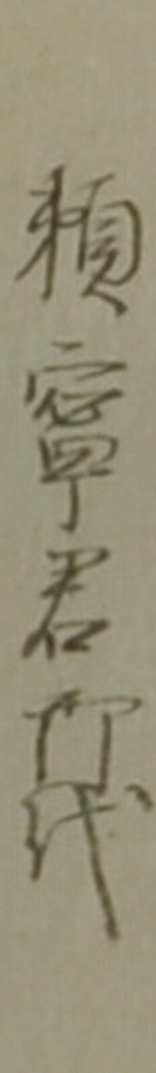頼寧君御代
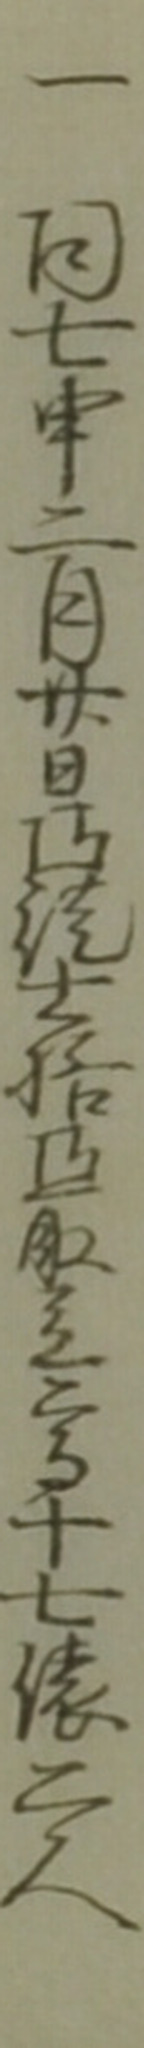一同七申二月廿日御徒士格御取立高十七高二人
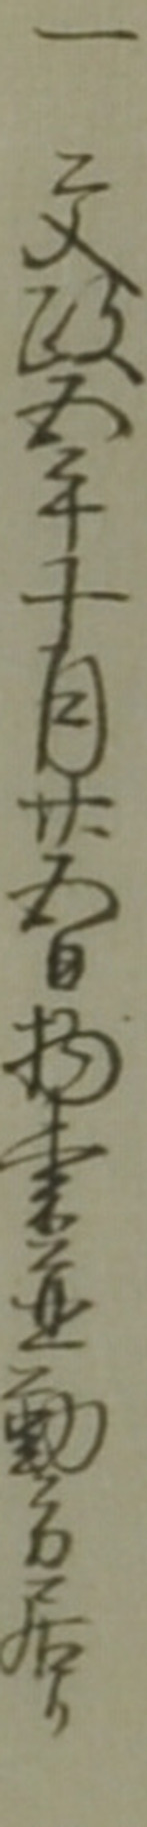一文政五午十月廿五日物書並勤方居リ
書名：無足諸士勤仕録（七）
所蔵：伊那市立高遠町図書館・合同会社AMANE
